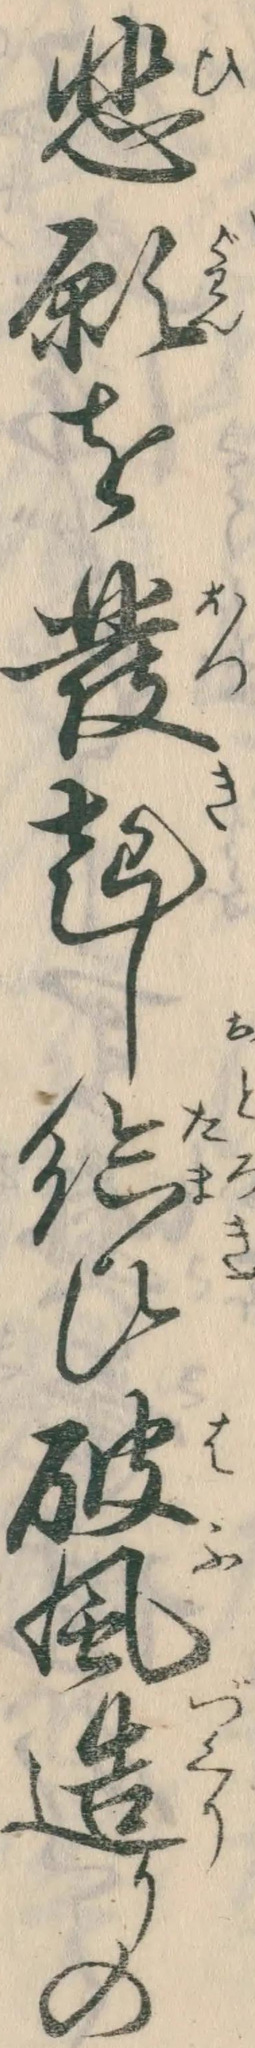悲願を発起し給ひ破風造の
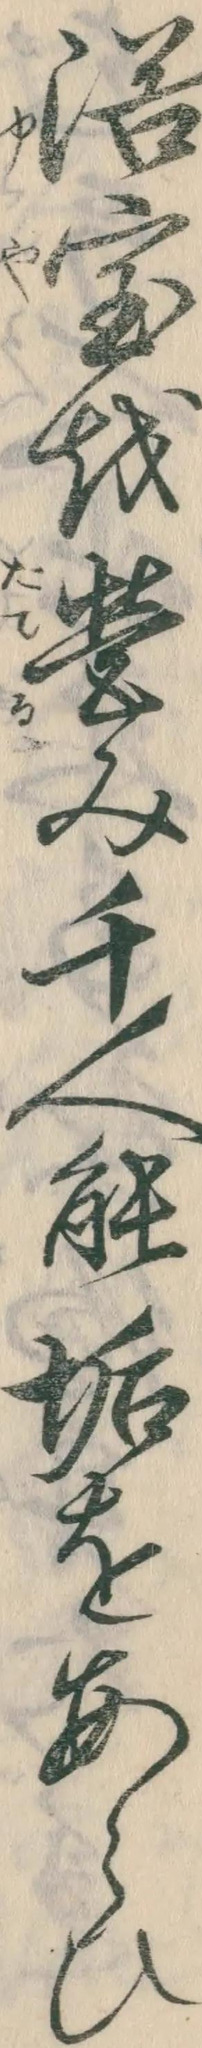浴室を営み千人能垢をあらひ
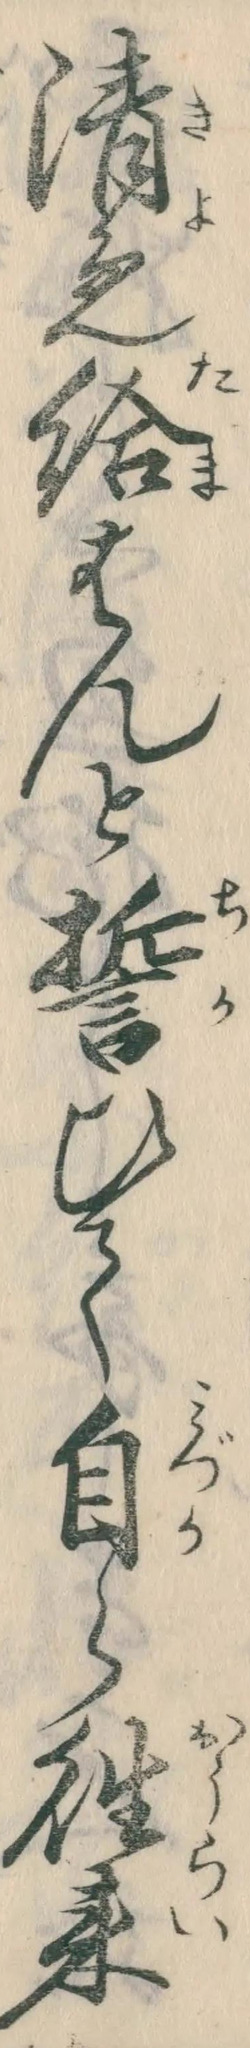清め給はんと誓ひて自ら往来
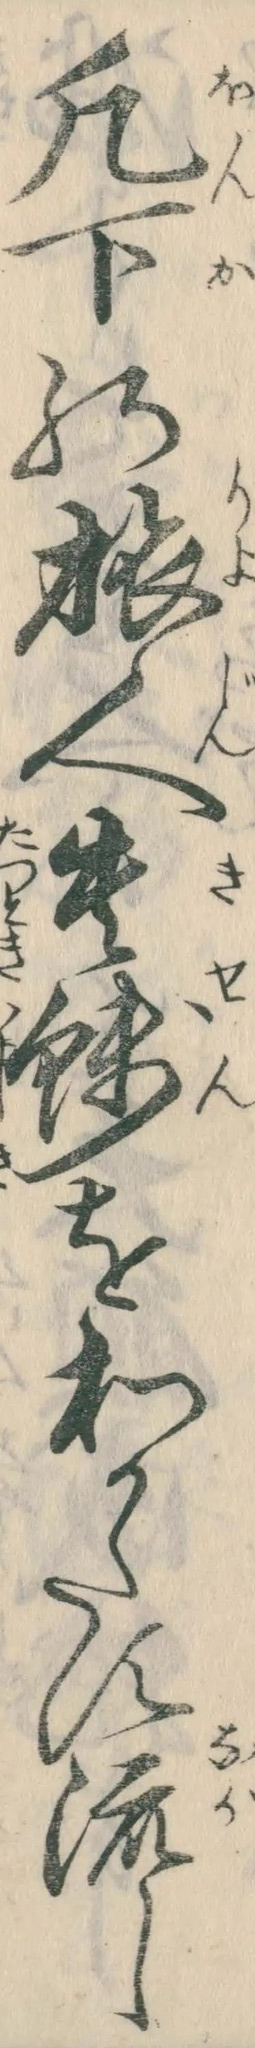凡下の旅人貴賤をわかたす流し
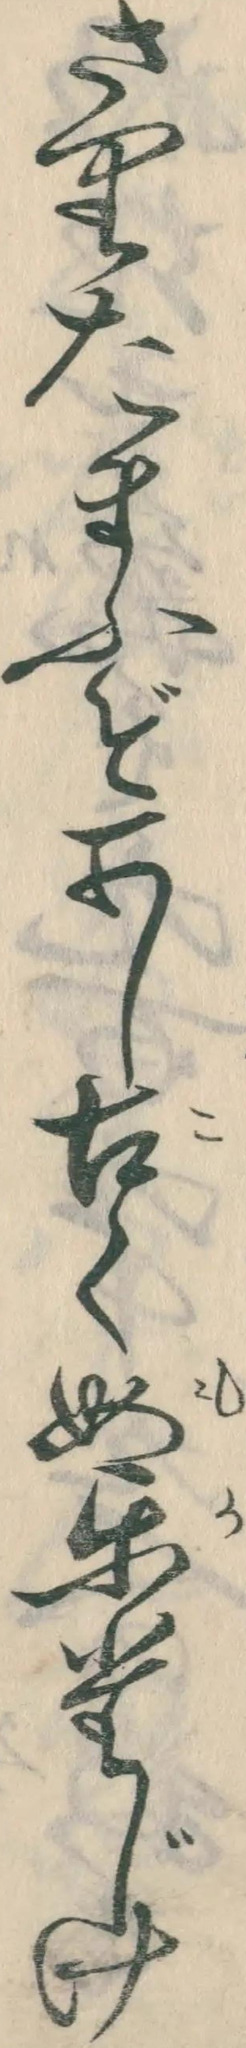さりたまふぞかし古く母閑たじけ

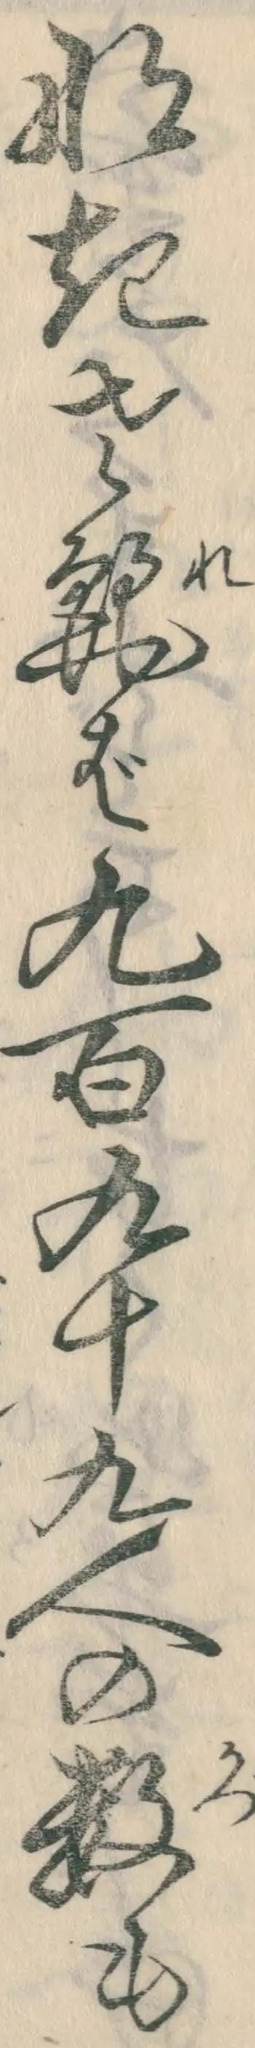なきさ麗ば九百九十九人の数も
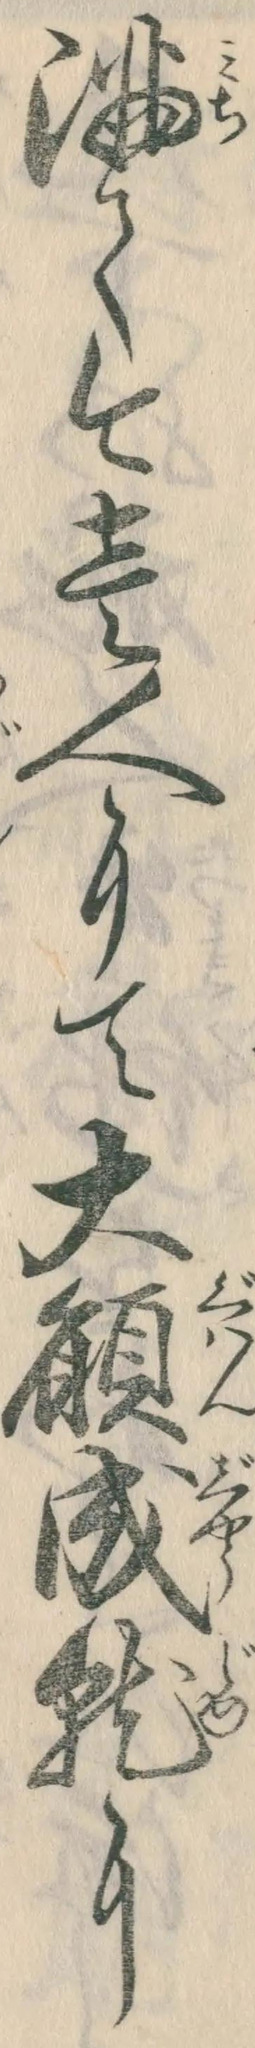満て今壱人にて大願成就に
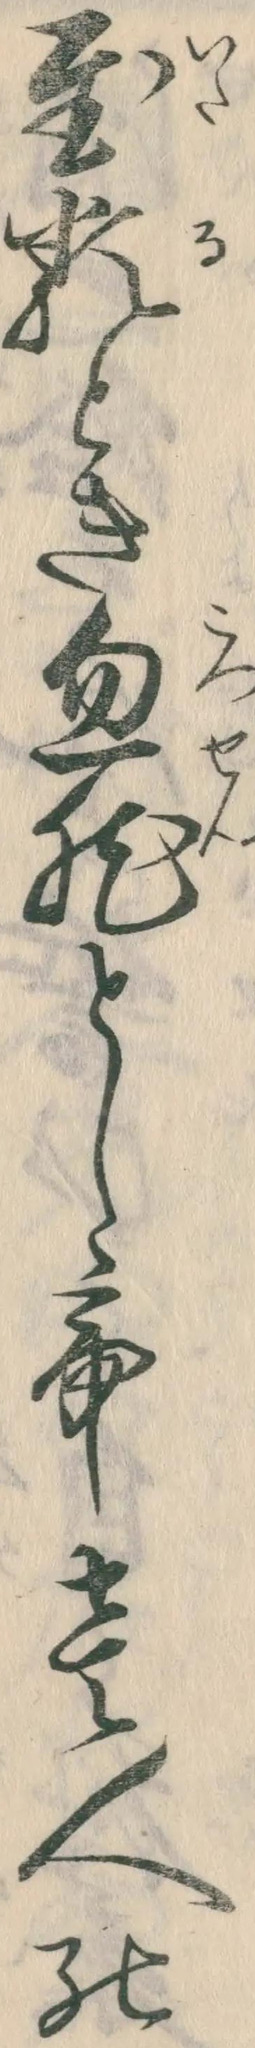至類とき忽然として壱人の
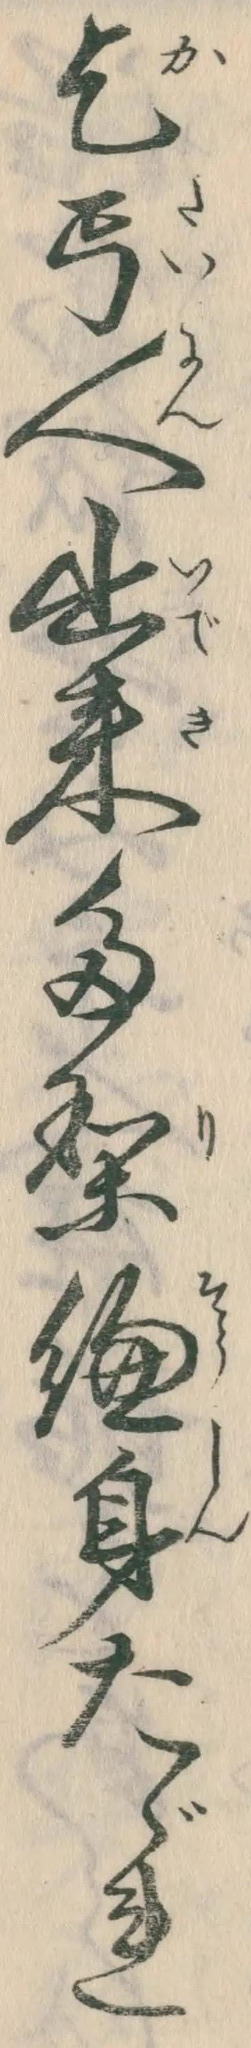乞丐人出来た梨総身たゞれ
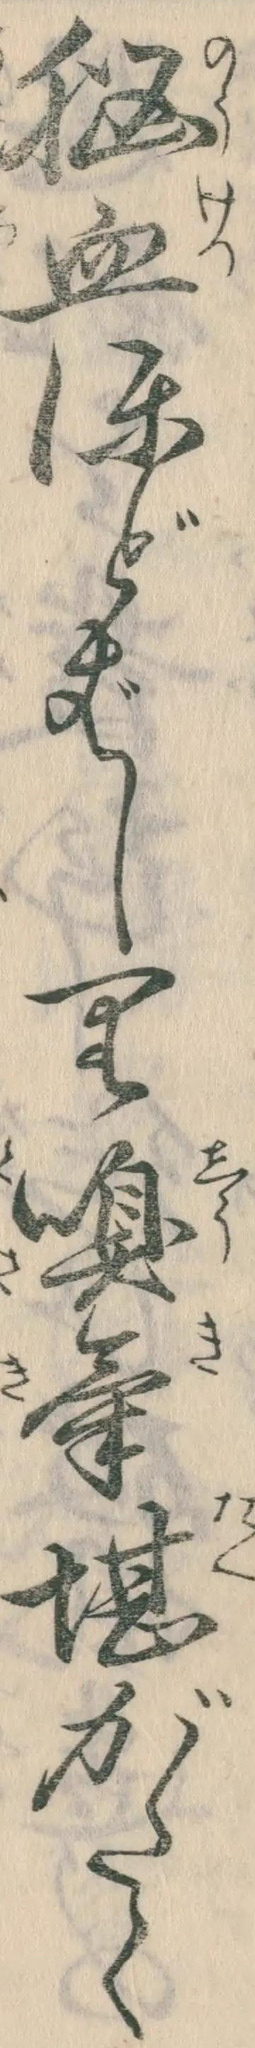脳血ほどばしり臭気堪がたく
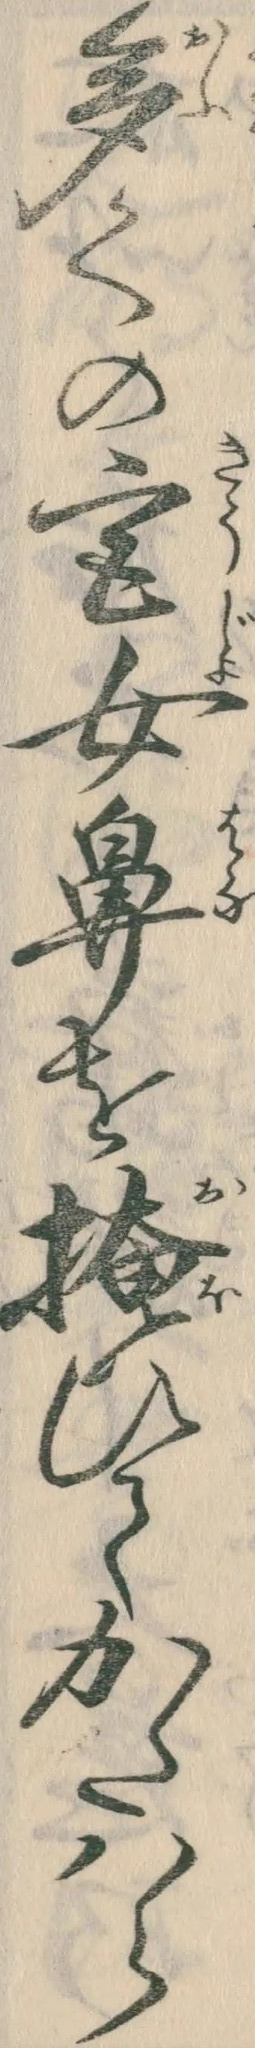多くの宮女鼻を掩ひてかたはら
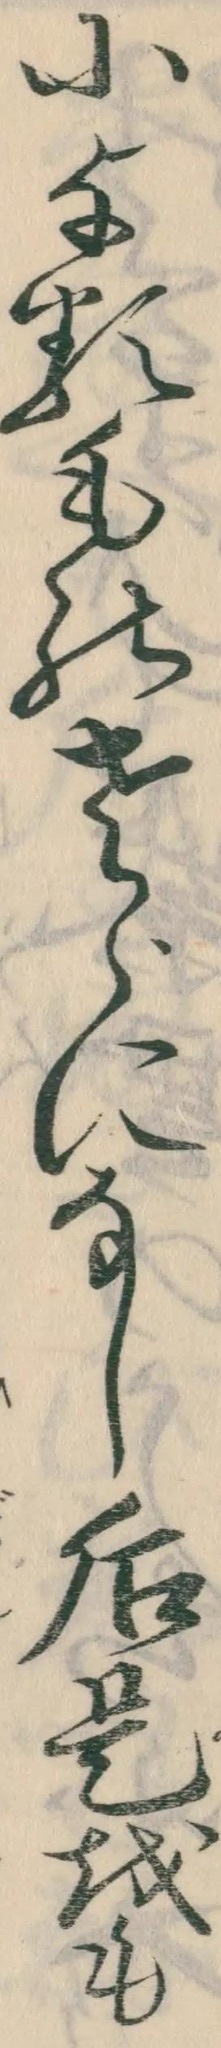によるものさらになし后是をも
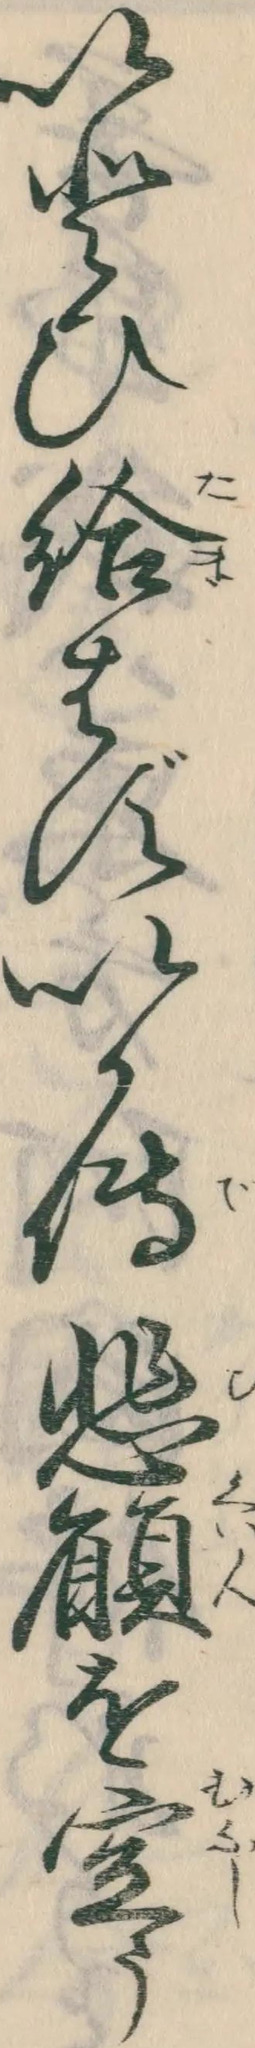いとひ給はずいか伝悲願を空う
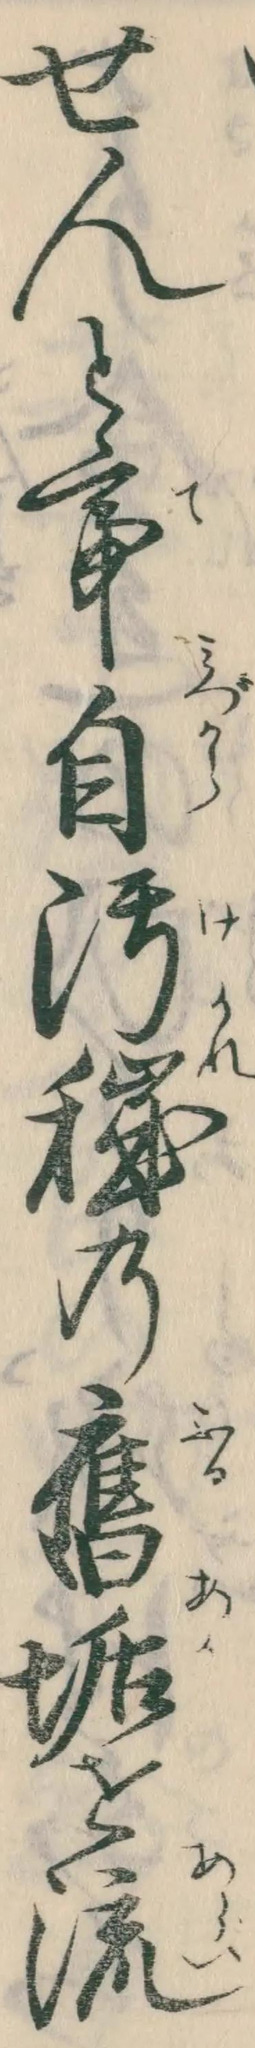せんと帝自汚穢の旧垢を流
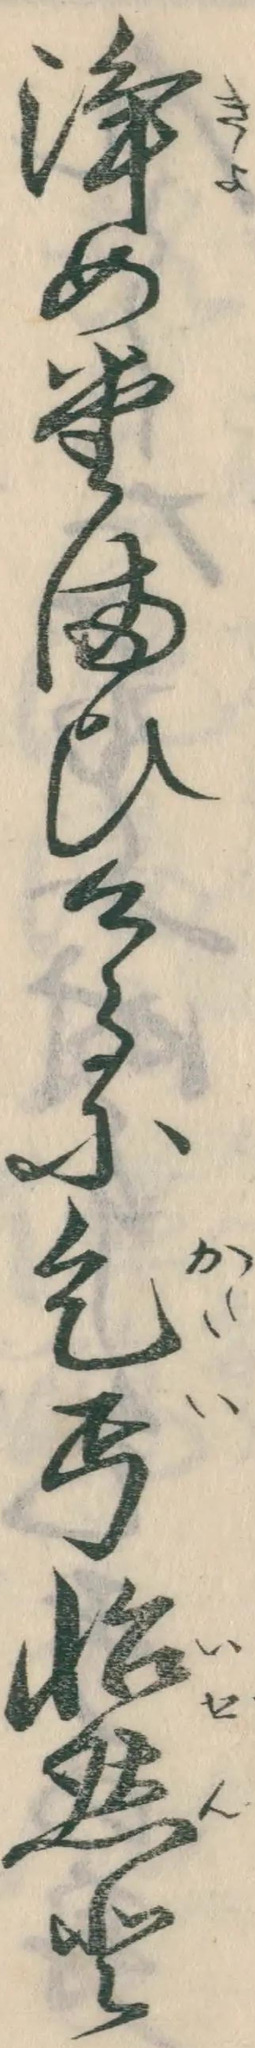浄めたまひけるに乞丐怡然と
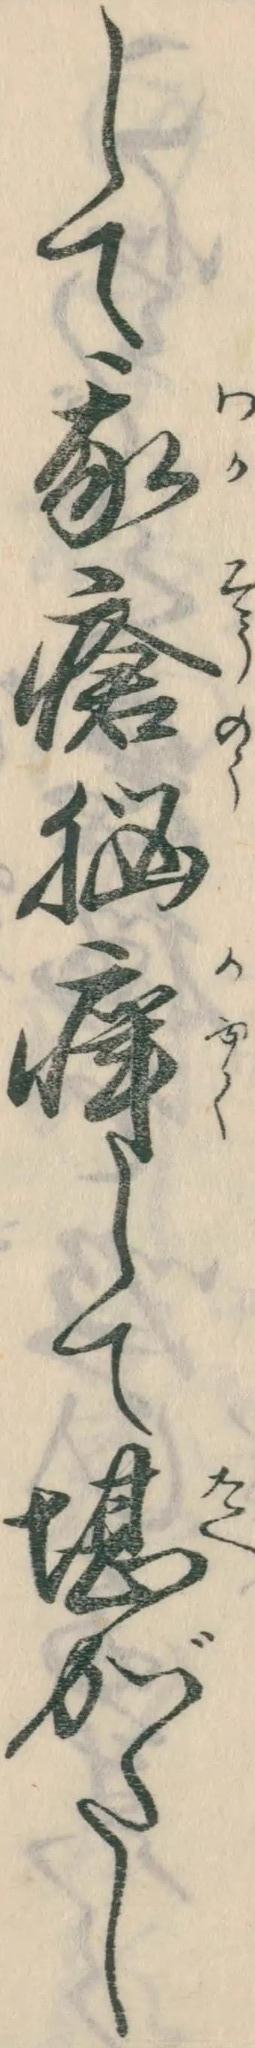して我瘡脳痒して堪がたし
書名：洗湯手引草
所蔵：国立国会図書館 National Diet Library, JAPAN
